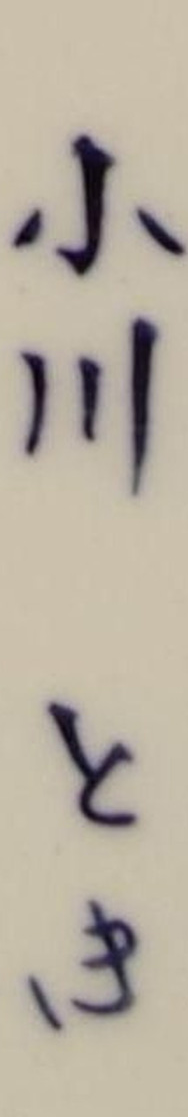小川とき
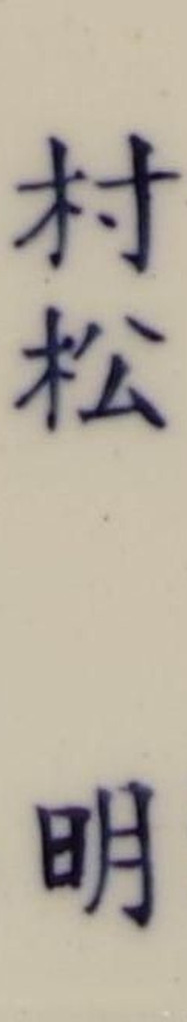村松明
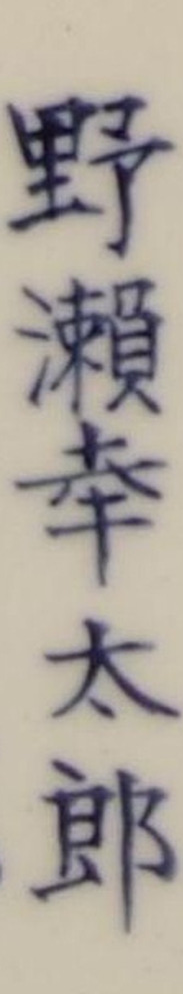野瀬幸太郎
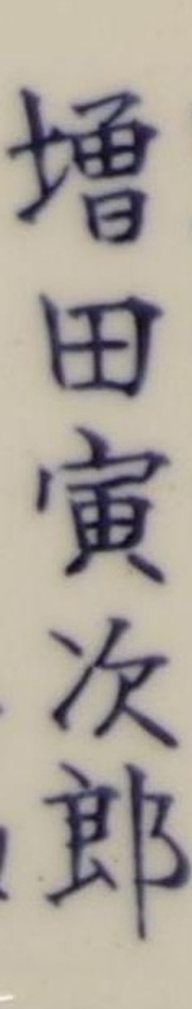増田寅次郎

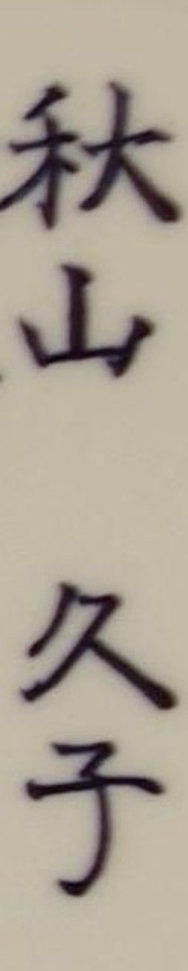秋山久子
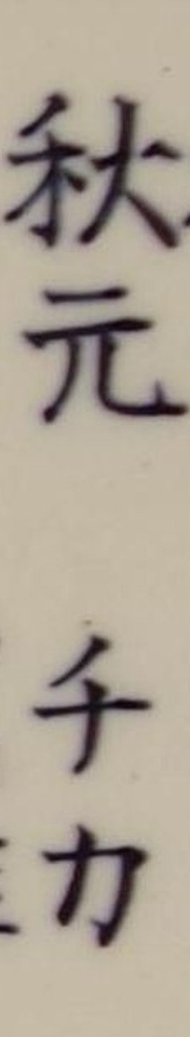秋元チカ
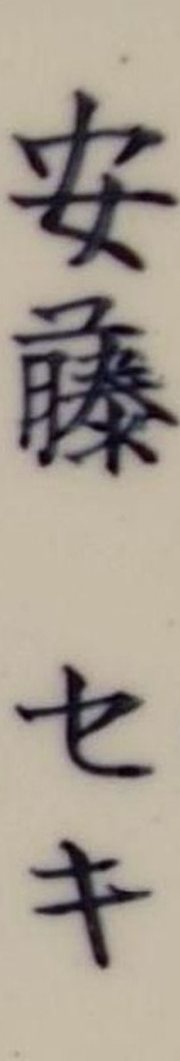安藤セキ
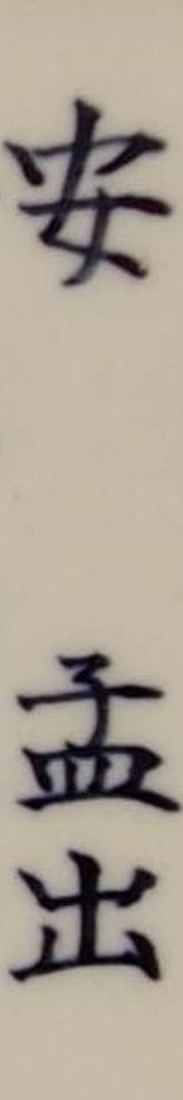安孟出
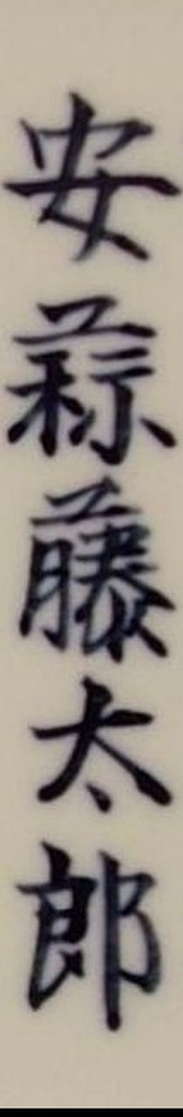安蒜藤太郎
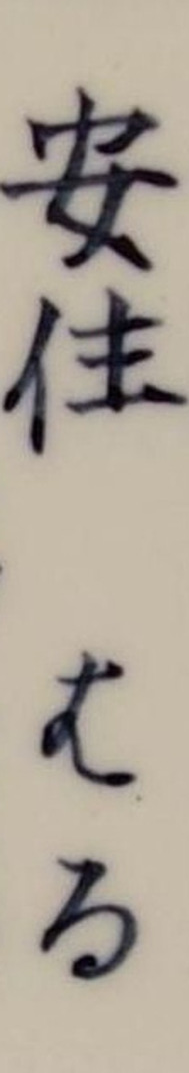安住はる
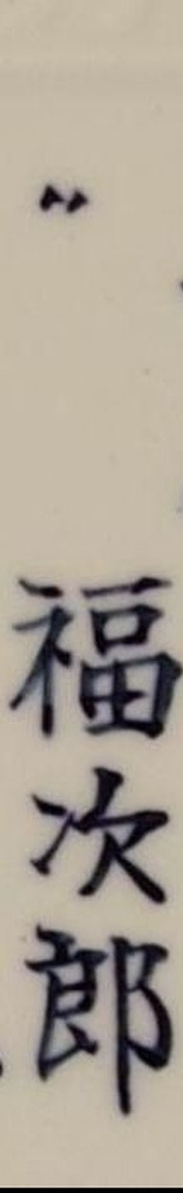福次郎
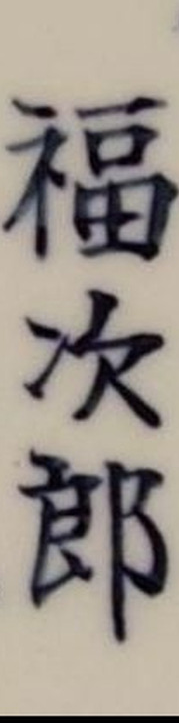福次郎
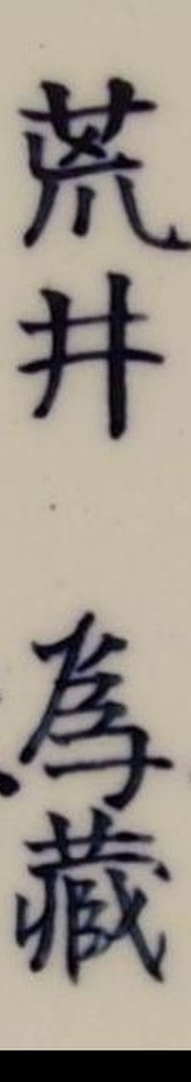荒井為蔵
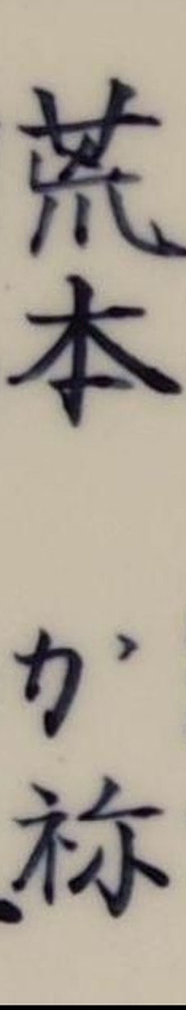荒本かね
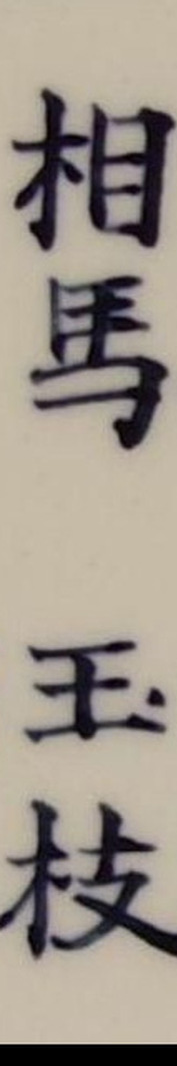相馬玉枝
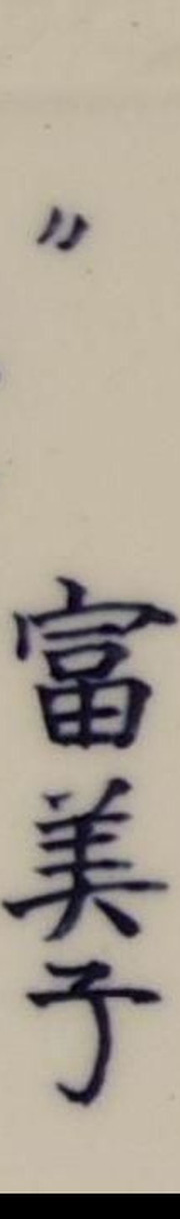富美子
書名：E~L
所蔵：高野山金剛峯寺
